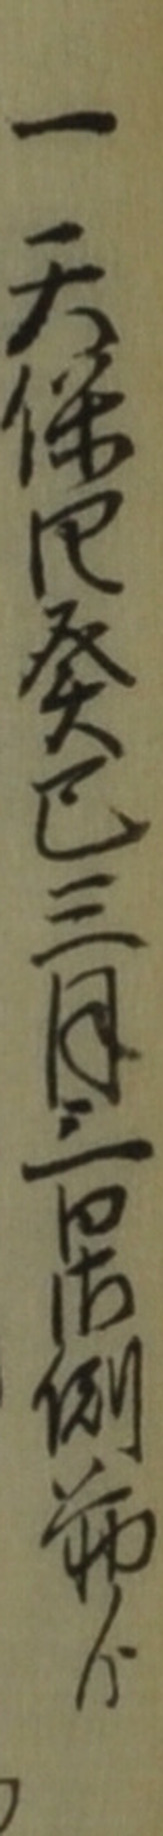一天保四癸巳三月三日御側勤ゟ
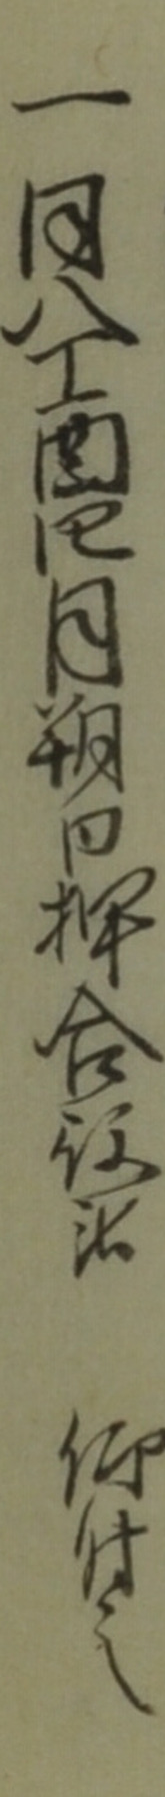一同八丁酉四月朔日押合役被仰付之
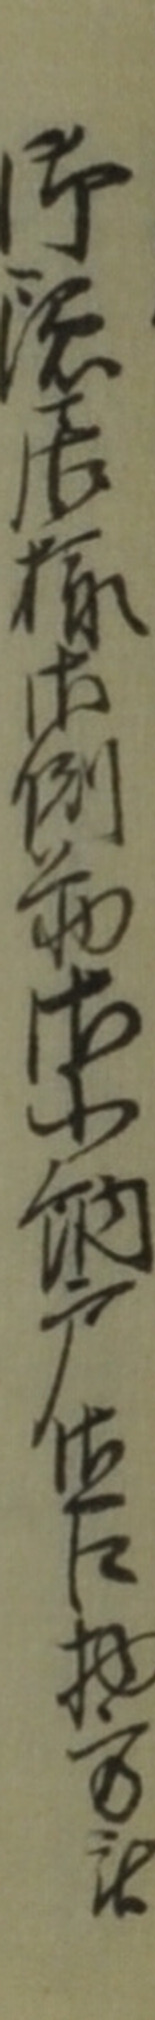御隠居様御側勤御小納戸御召物被
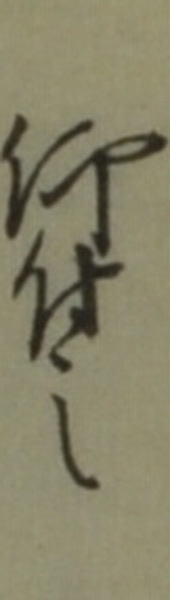仰付之
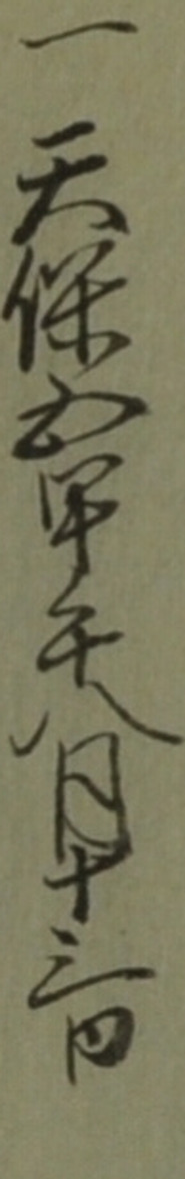一河野五甲午八月十三日
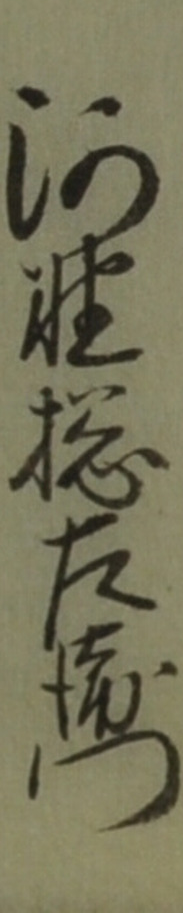河野捴左衛門
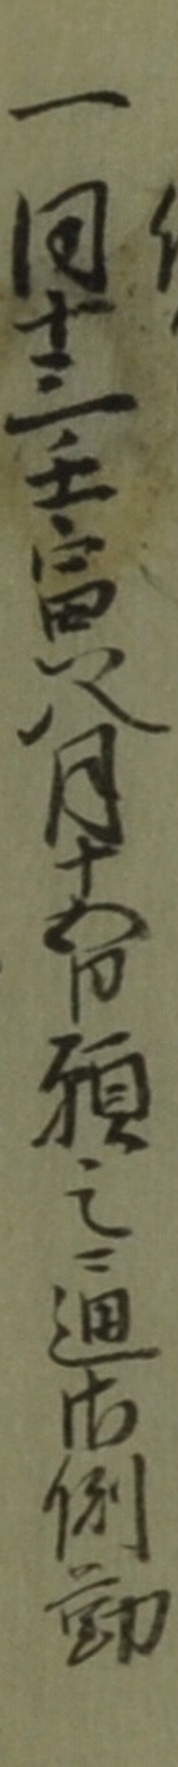一同十三壬寅八月十五日願之通御側勤
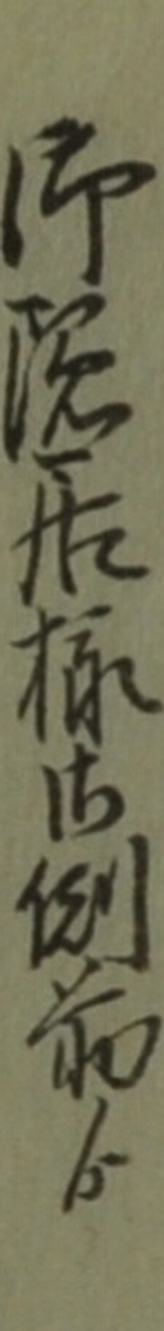御隠居様御側勤ゟ
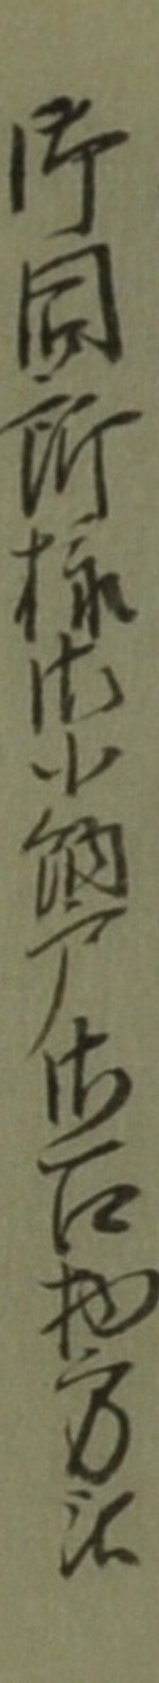御同断様御小納戸御召物方被
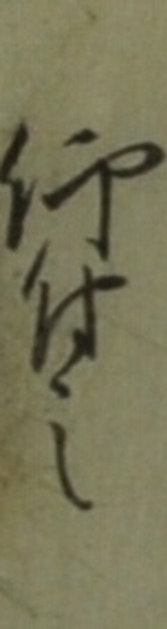仰付之
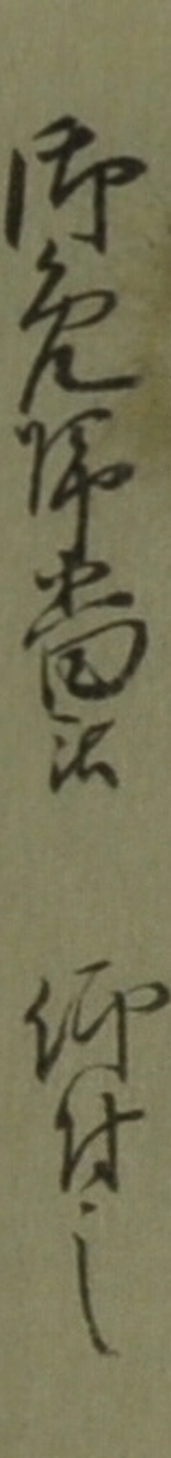御免帰番被仰付之

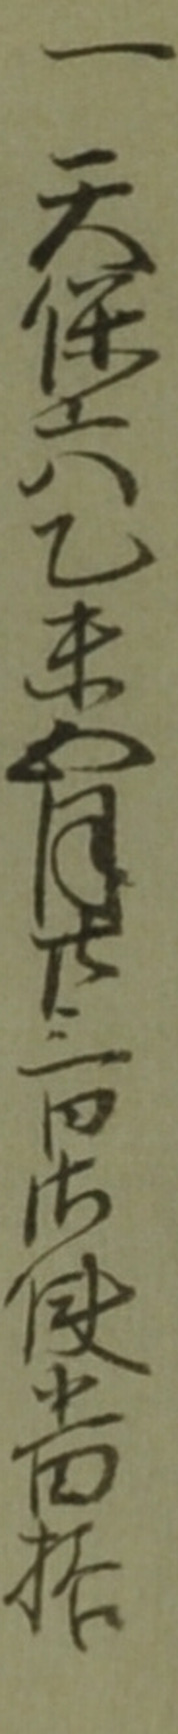一天保六乙未五月廿三日御使番格
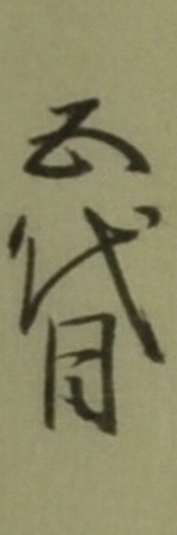五代目
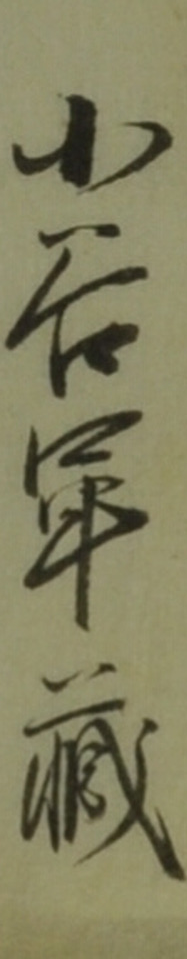小谷軍蔵
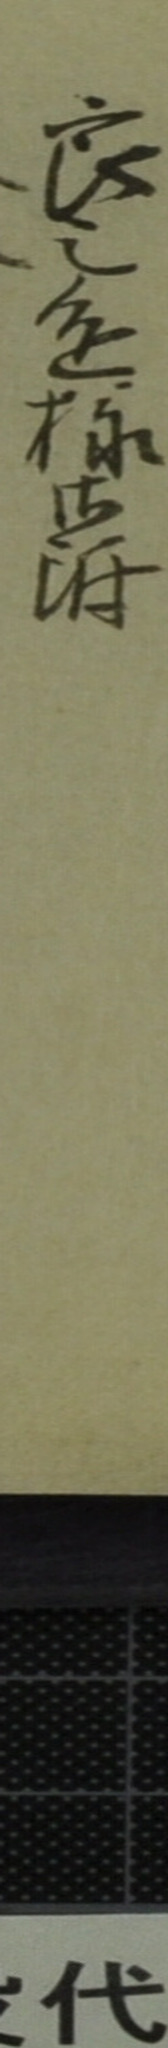良之進様御附
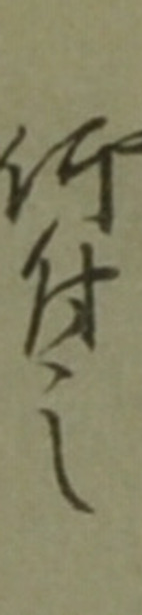仰付之
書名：諸御役代々録（四）
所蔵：伊那市立高遠町図書館・合同会社AMANE
